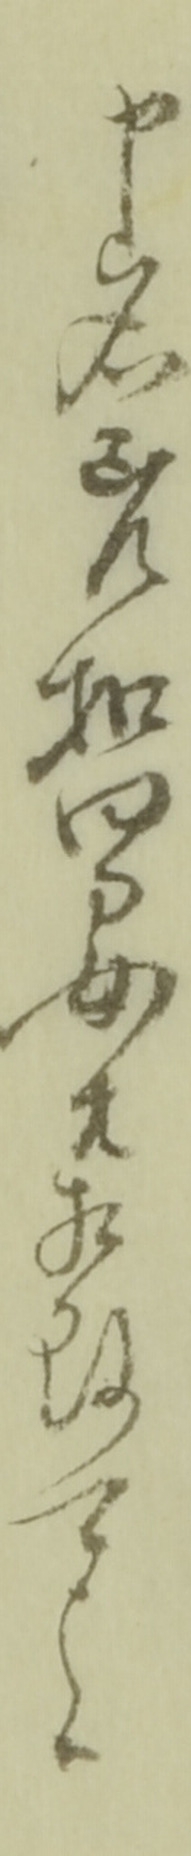申名差控男女共相改可申候
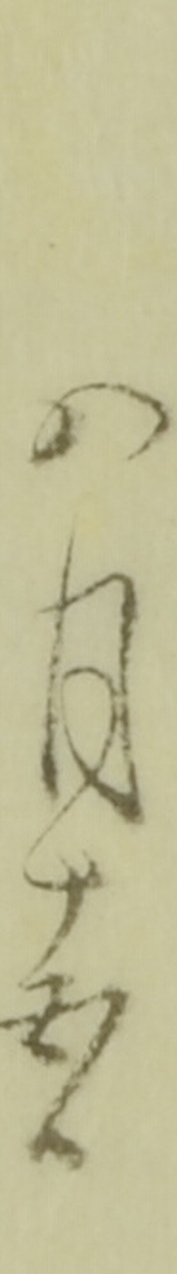八月十五日

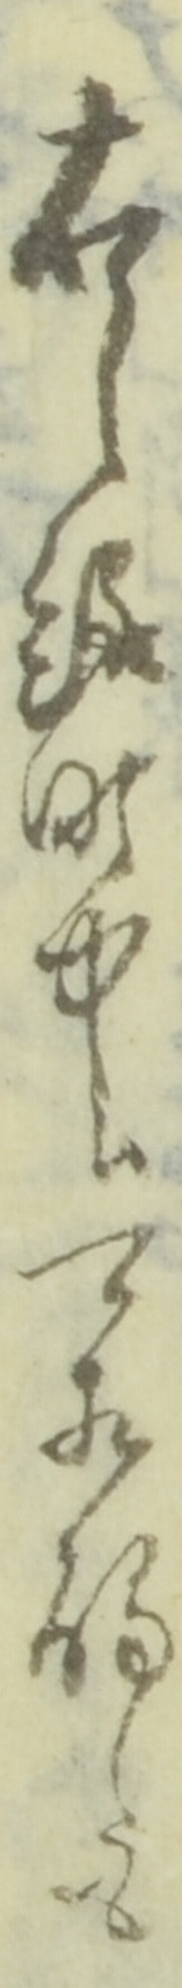右之趣町中江可相触候以上
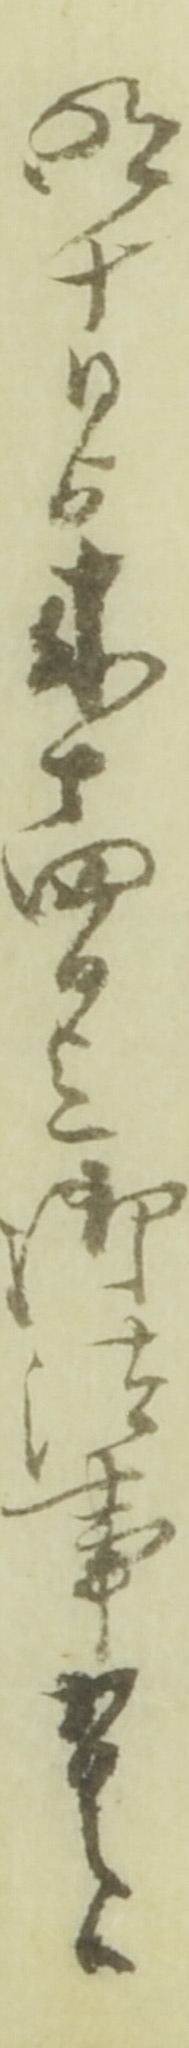明十日より来十四日迄ご法事有之候
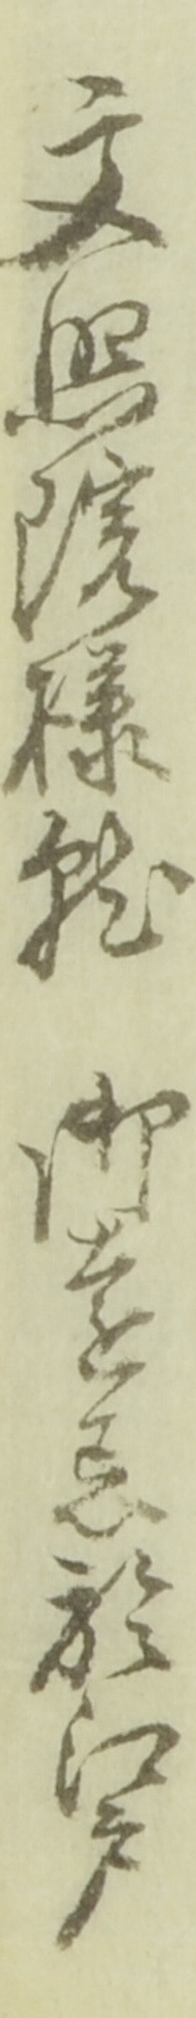文熙院様就御遠忌於江戸
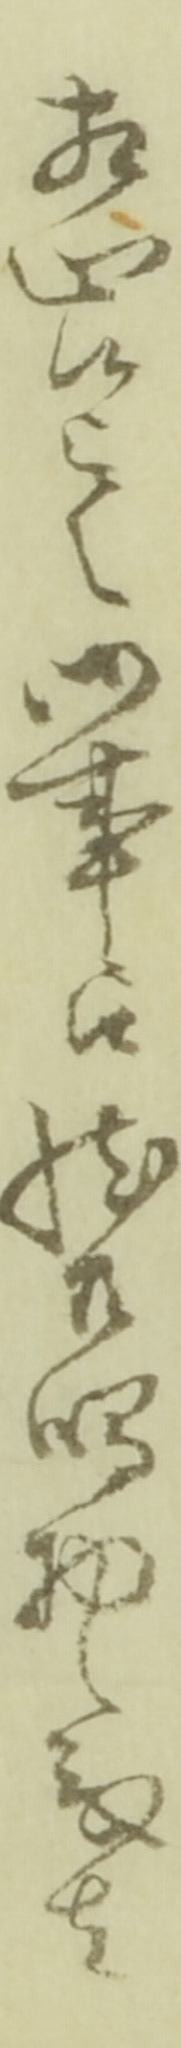相止候旨之御事二候然共鳴物之義者
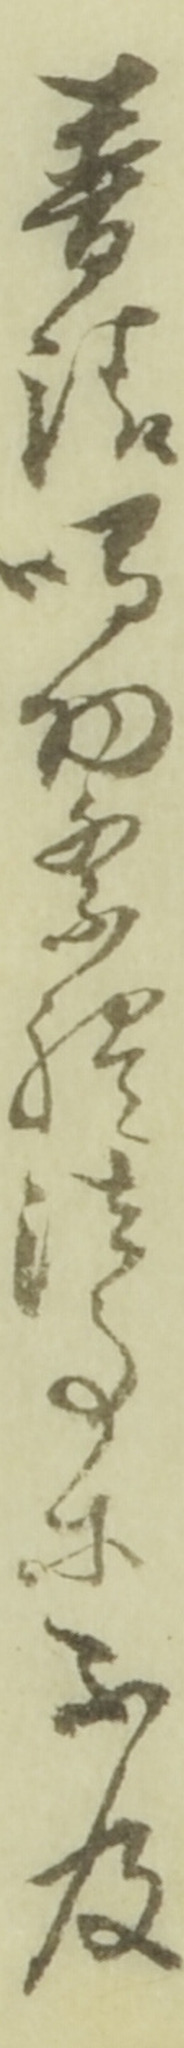普請鳴物祭礼法事等不及
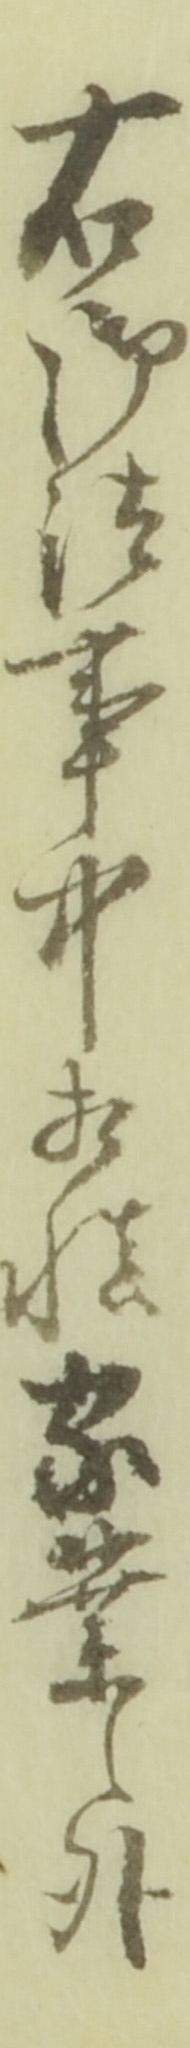右御法事中相慎家業之外
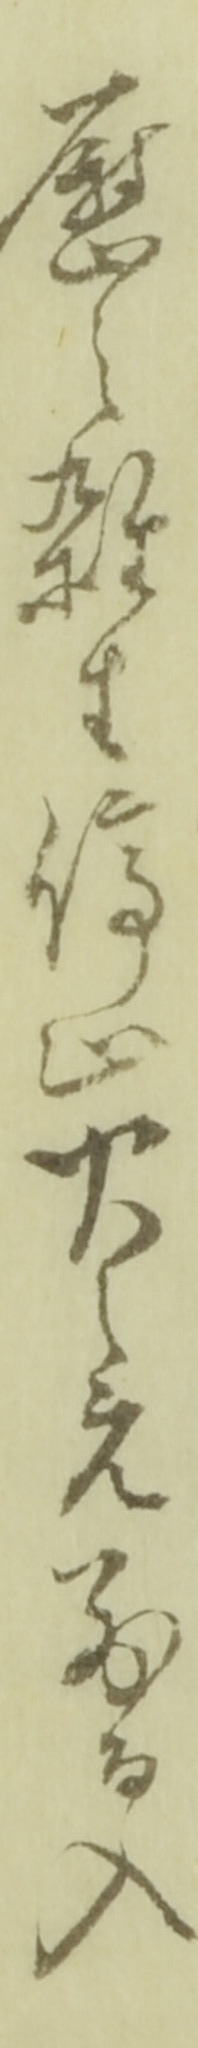應之雑生停止火之元若而入
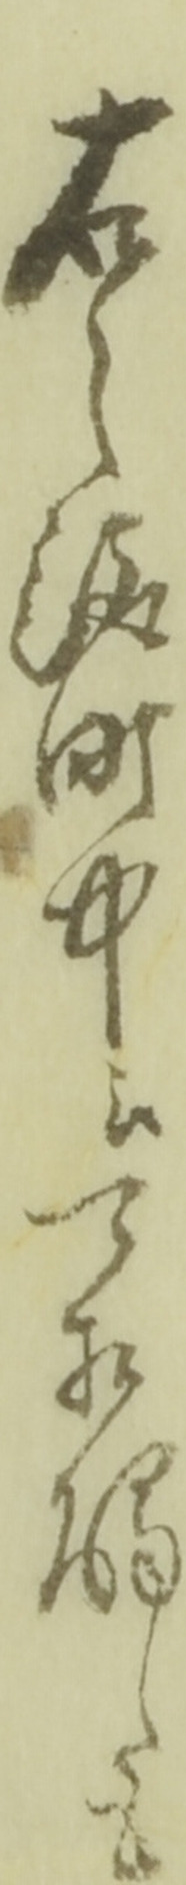右之趣町中江可相触候以上
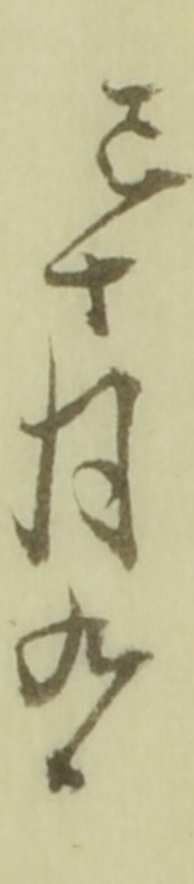己十月九日
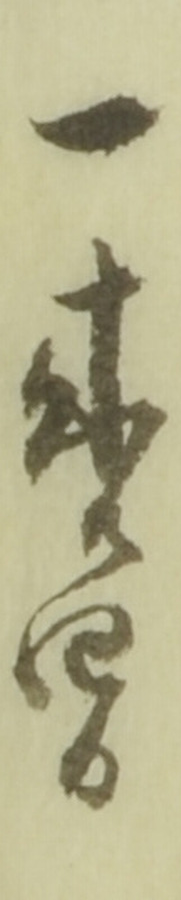一来ル四日
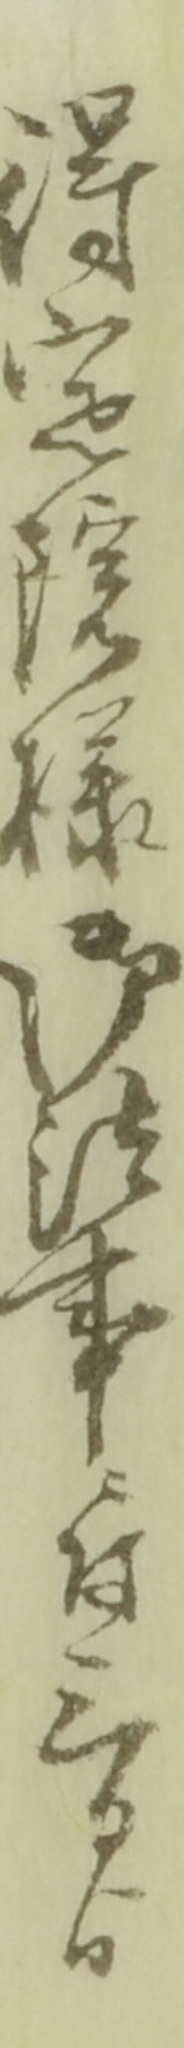得定院様御法事二付三日より
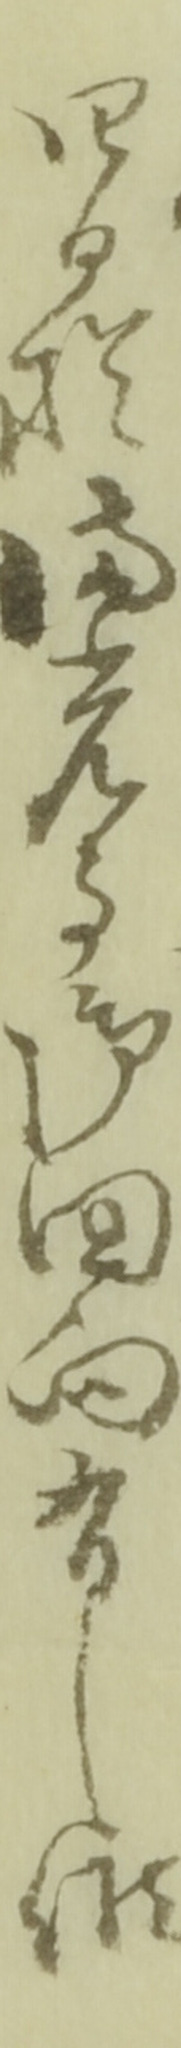四日迄満光寺御回向有之候
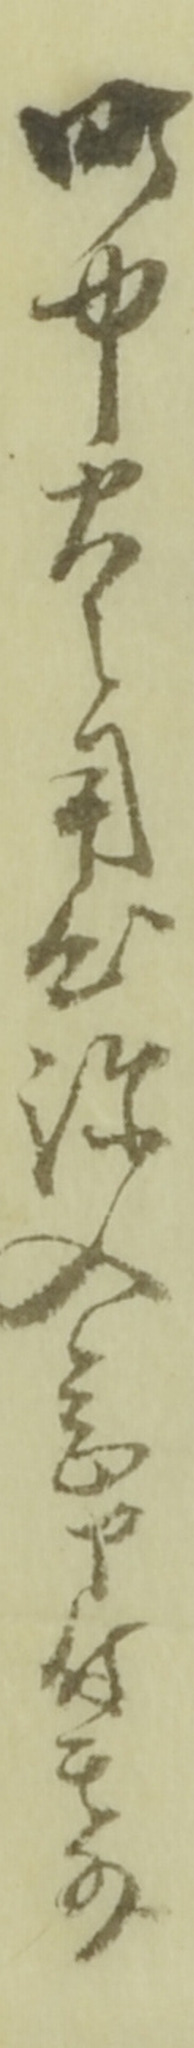町中火之用心殊入念申付其外
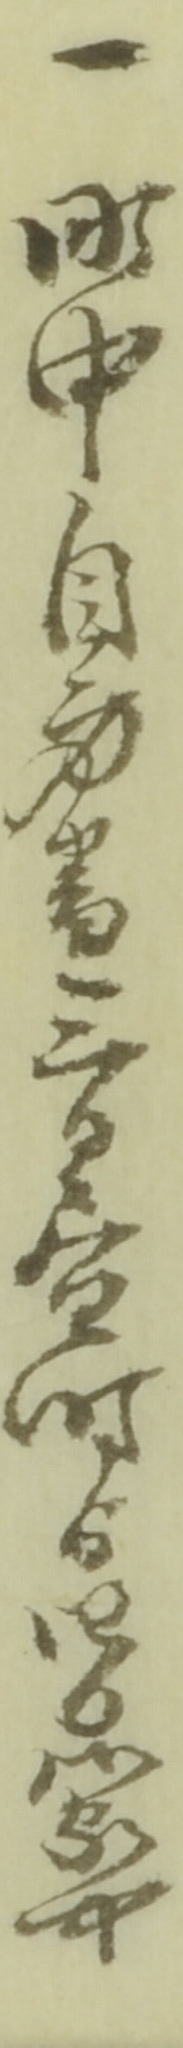一町中自身番三日昼時より家中
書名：御公儀様御領主様御触書控
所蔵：伊那市立高遠町図書館・合同会社AMANE
